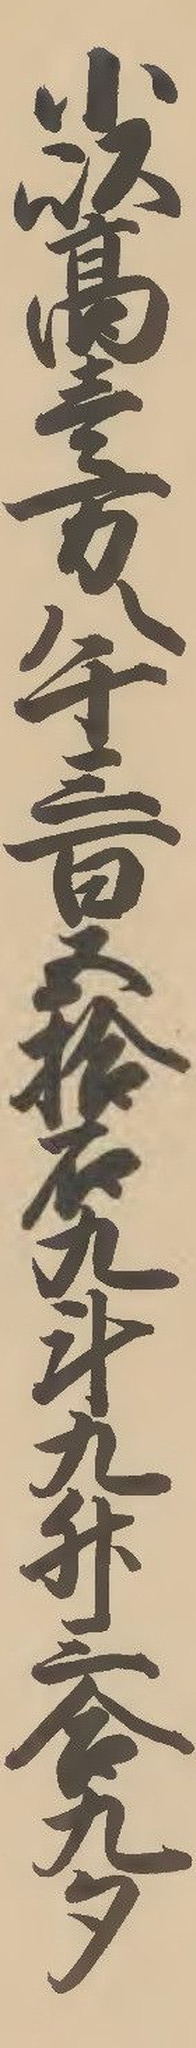小以高壱万八千三百五拾石九斗九升三合九勺
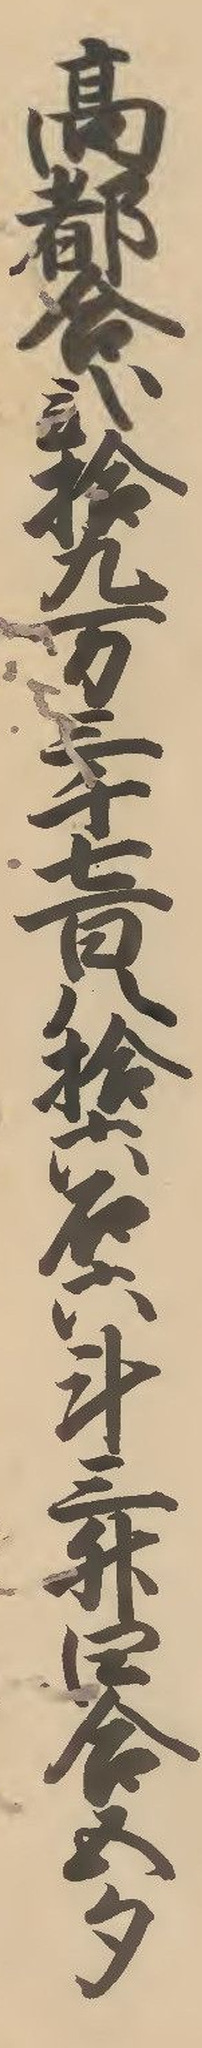高都合弐拾九万三千七百八拾六石六斗三升四合五勺

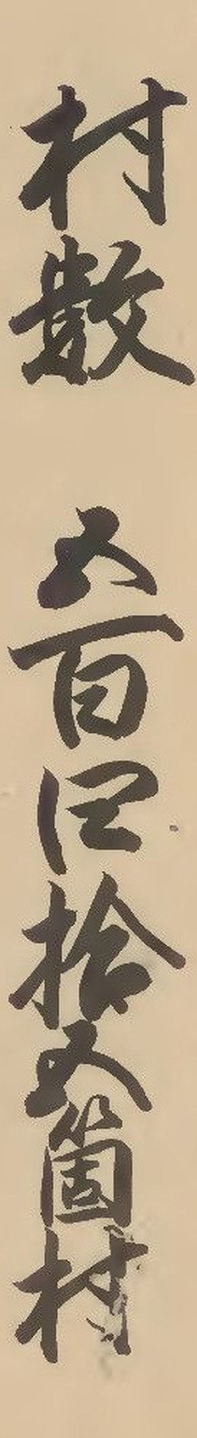村数五百四拾五箇村
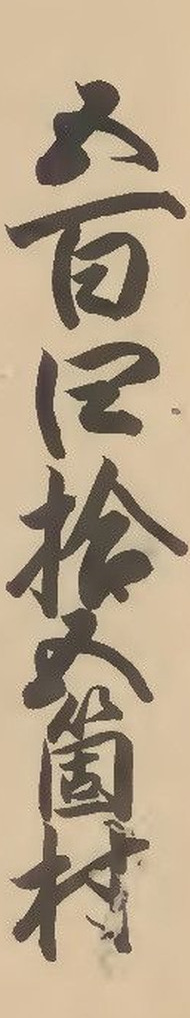村数五百四拾五箇村
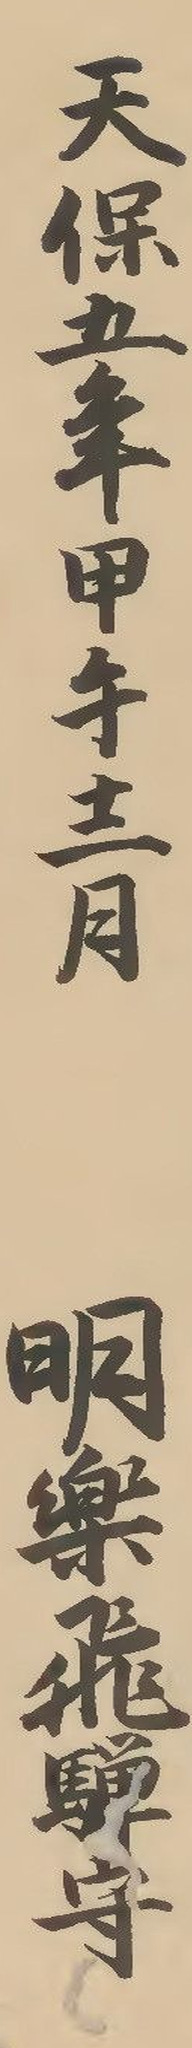天保五年甲午十二月明楽飛騨守
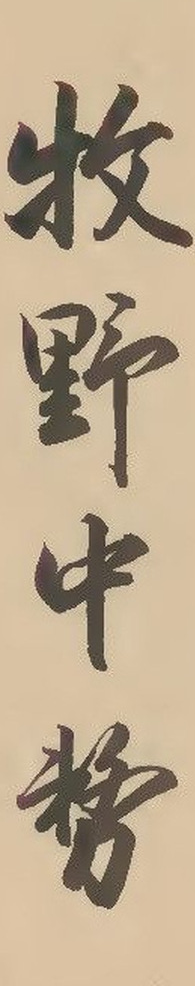牧野中務
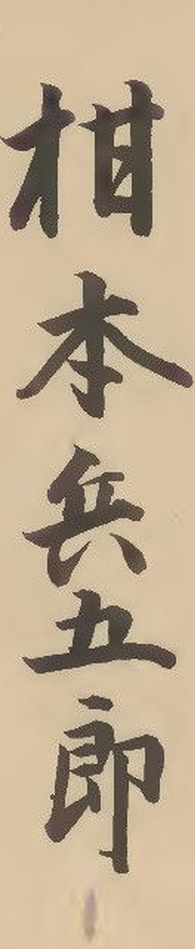柑本兵五郎
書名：河内国郷帳
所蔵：国立公文書館 National Archives of Japan
